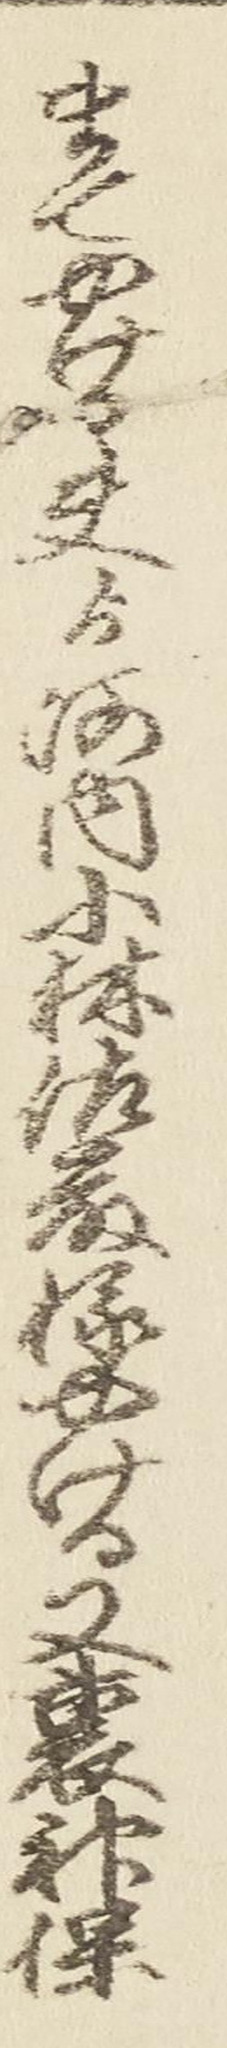まてやける夫ゟ河内小林佐藤様やける又裏神保
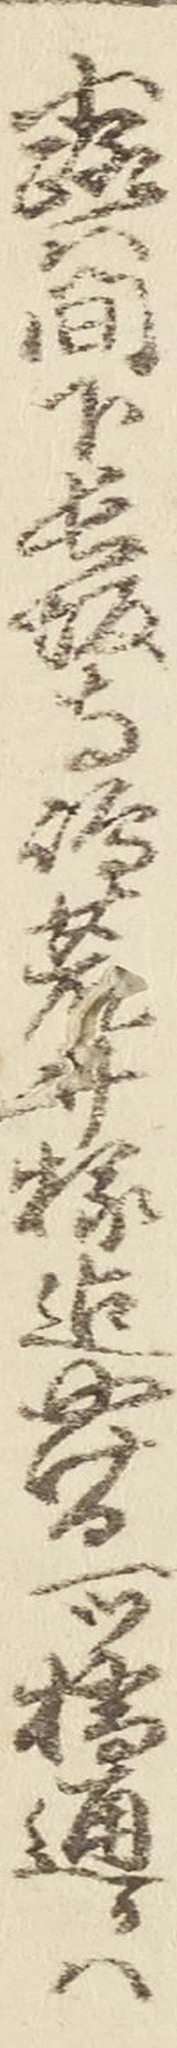小路は間下長坂寺嶋荒井様迄やける一ツ橋通りは
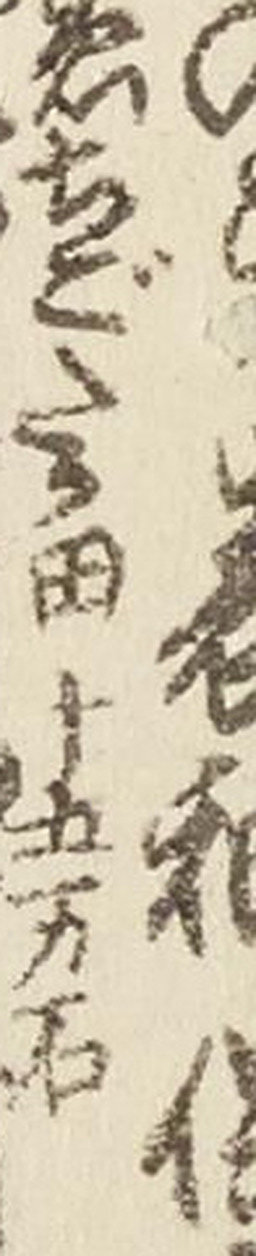ゑちごたか田十五万石
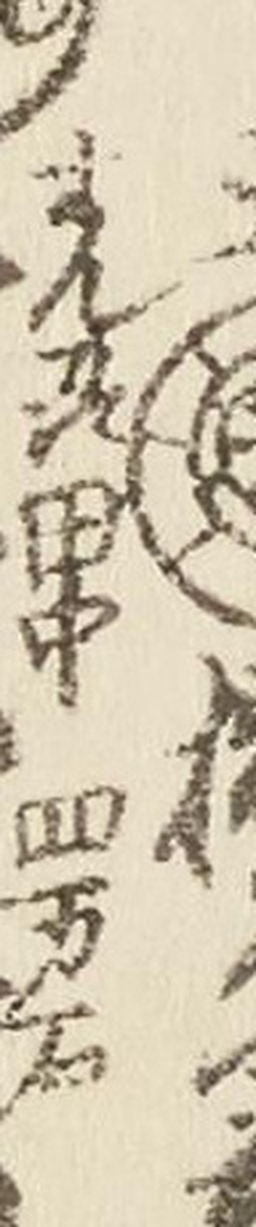すん州田中四万石
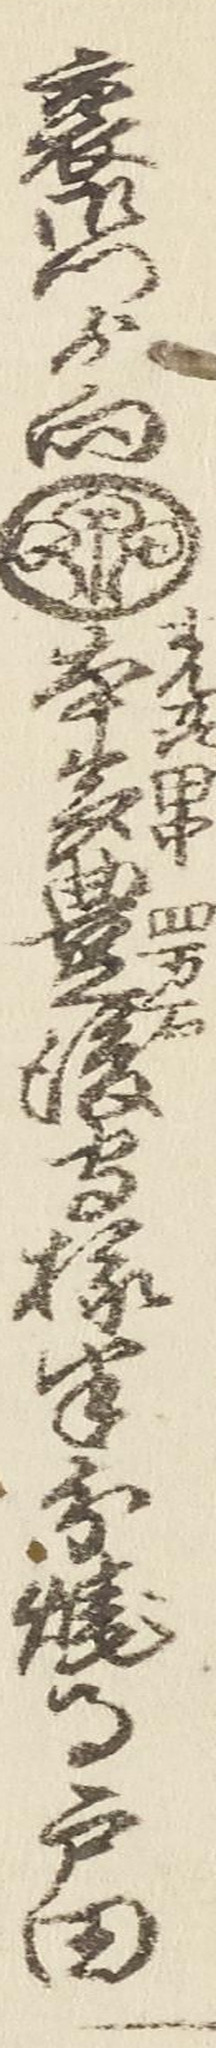裏御門ゟ向本多豊後守様半分焼る戸田
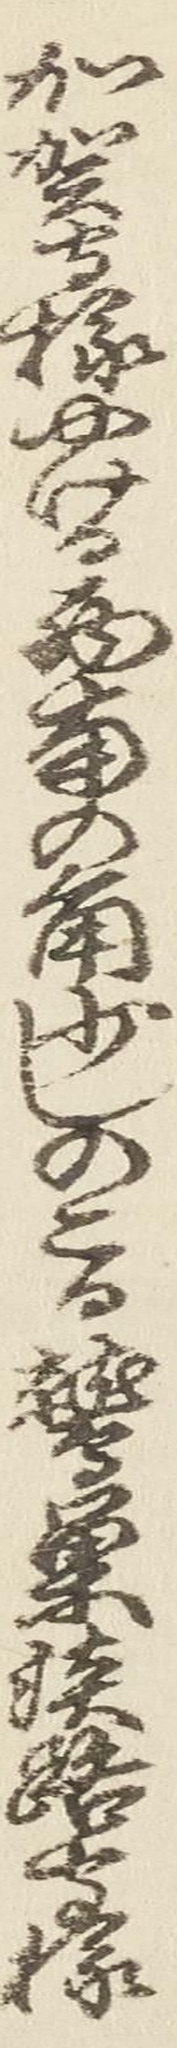加賀守様やける西南の角少しのこる鷲巣淡路守様
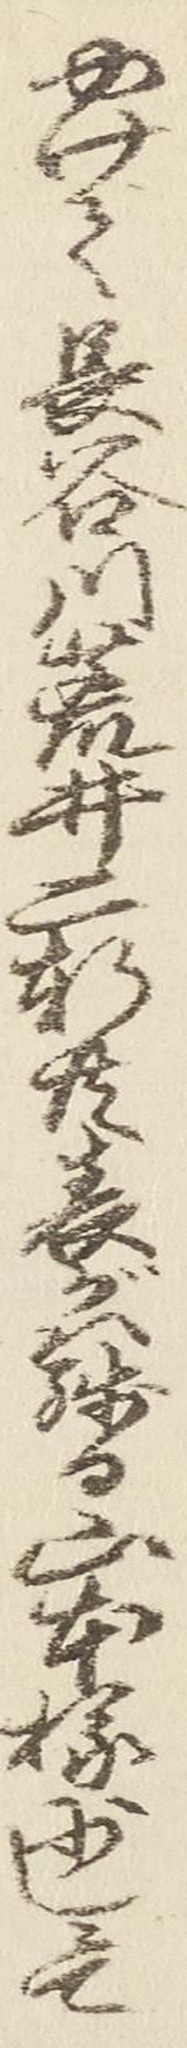やけて長谷川荒井二軒共表がは残る山本様少しニて
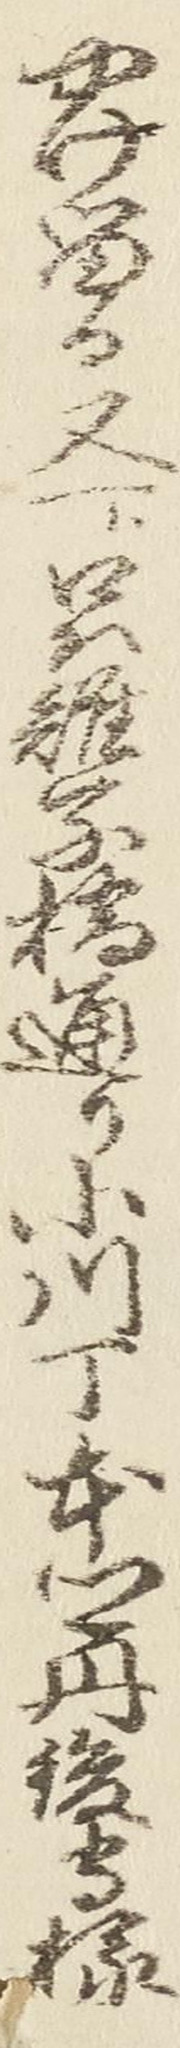やけ留る又一ト口は雉子橋通り小川丁本郷丹後守様
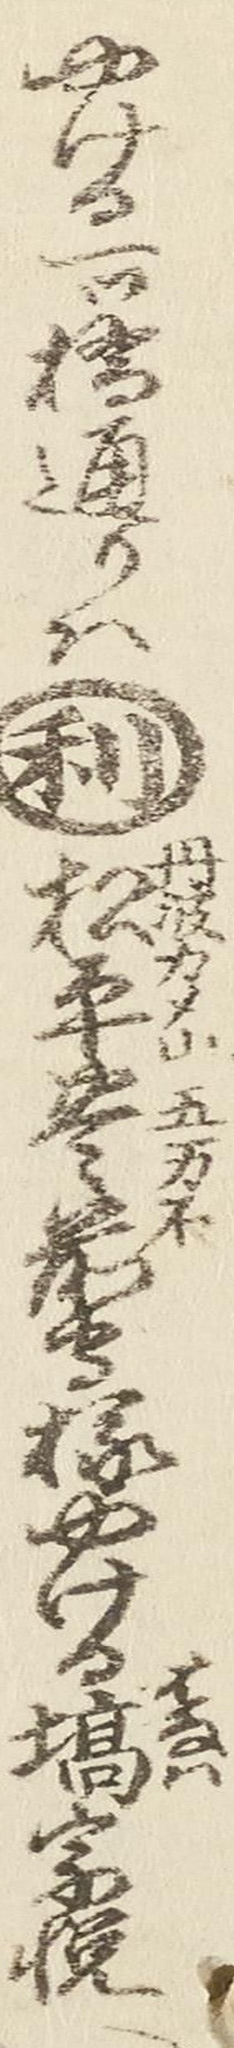やける一ツ橋通りは松平豊前守様やける塙宗悦
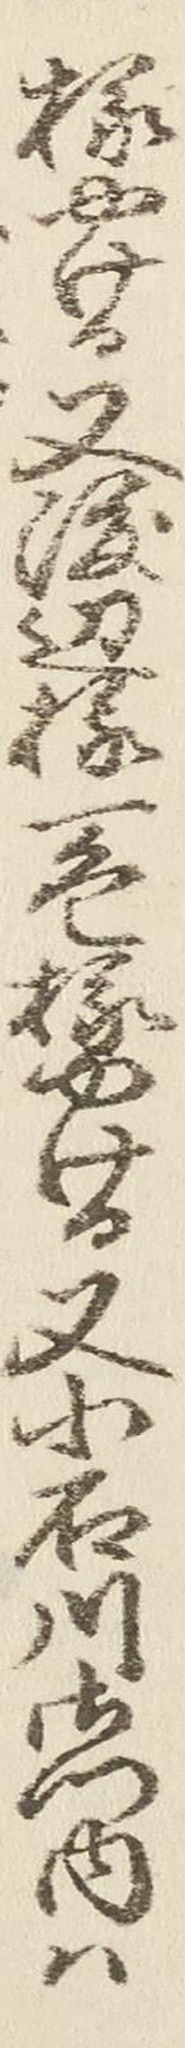様やける又渡辺様一色様やける又小石川御門内は
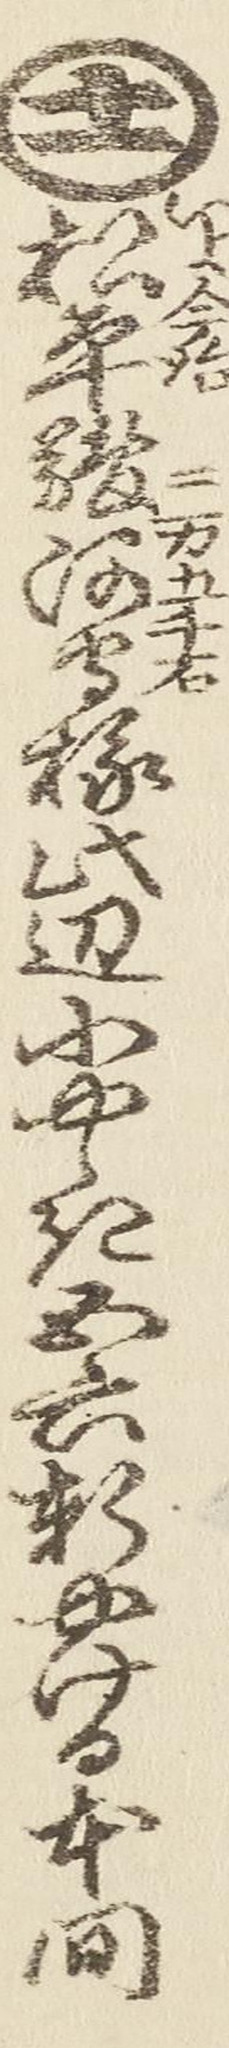松平駿河守様此辺小やき五六軒やける本間
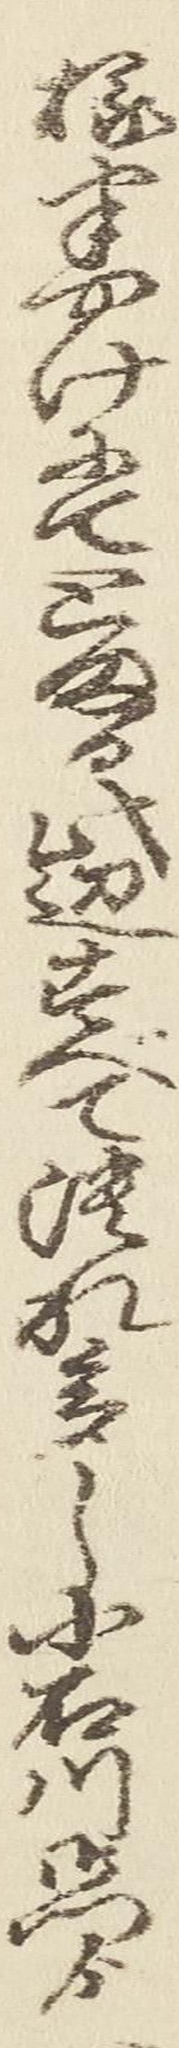様半やけにてとまる此辺すべて潰れ多し小石川御門ゟ
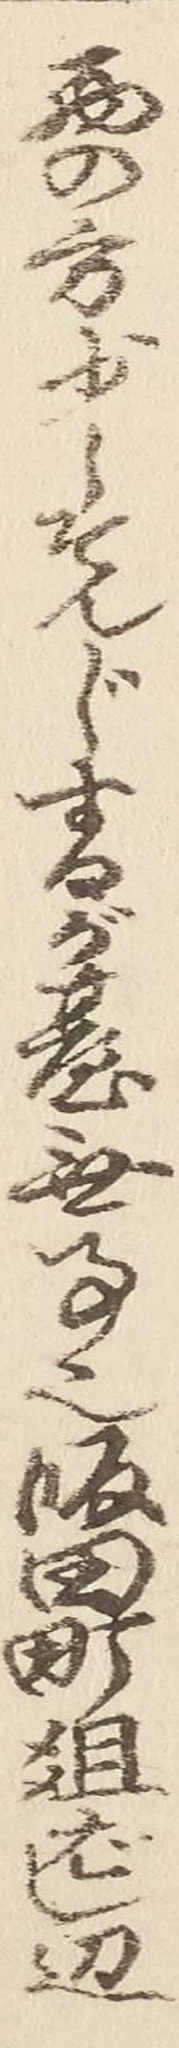西の方少しそんじするが台無事也飯田町俎ばし辺
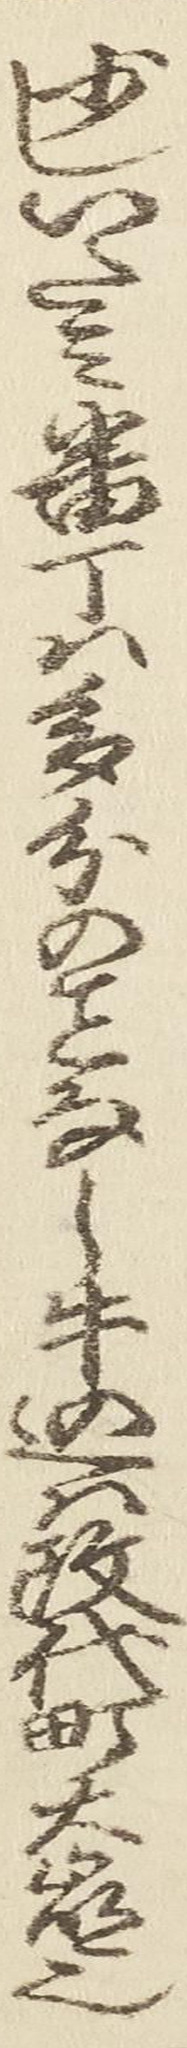少しいたみ番丁は多分のことなし牛込は改代町大崩也

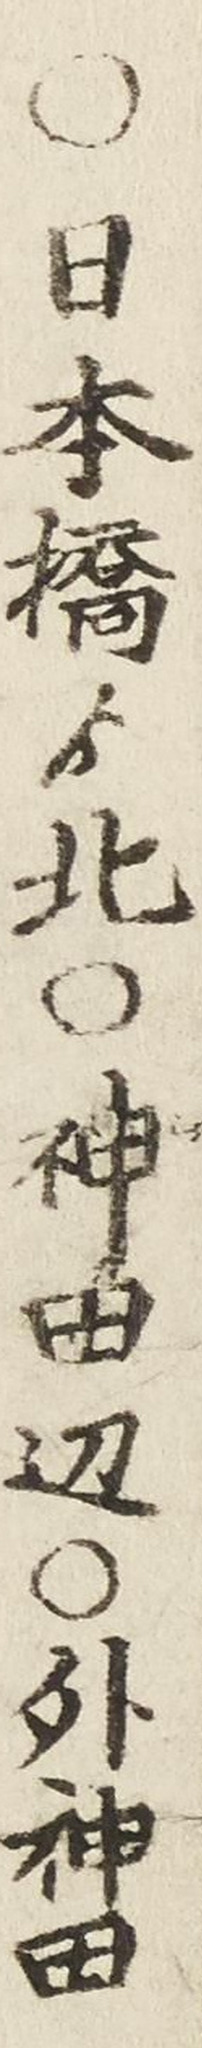第四○日本橋ゟ北○神田辺○外神田
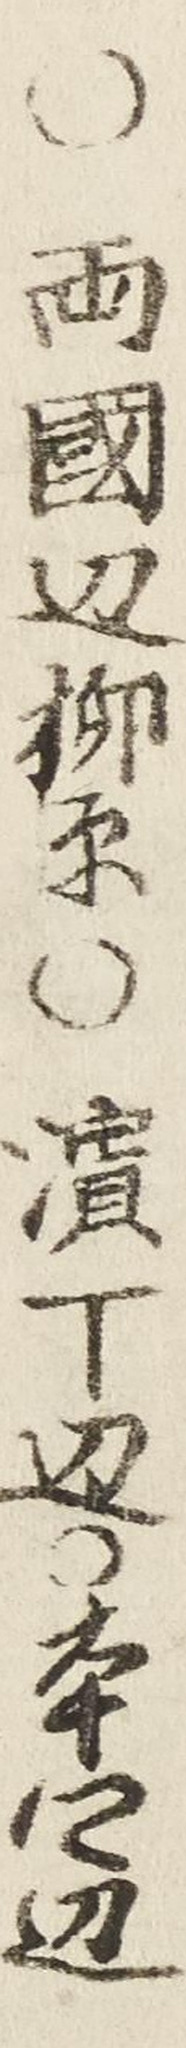○両国辺柳原○浜丁辺○本郷辺
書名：江戸みやげ
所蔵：東京大学地震研究所図書室 Earthquake Research Institute Library, The University of Tokyo, JAPAN
